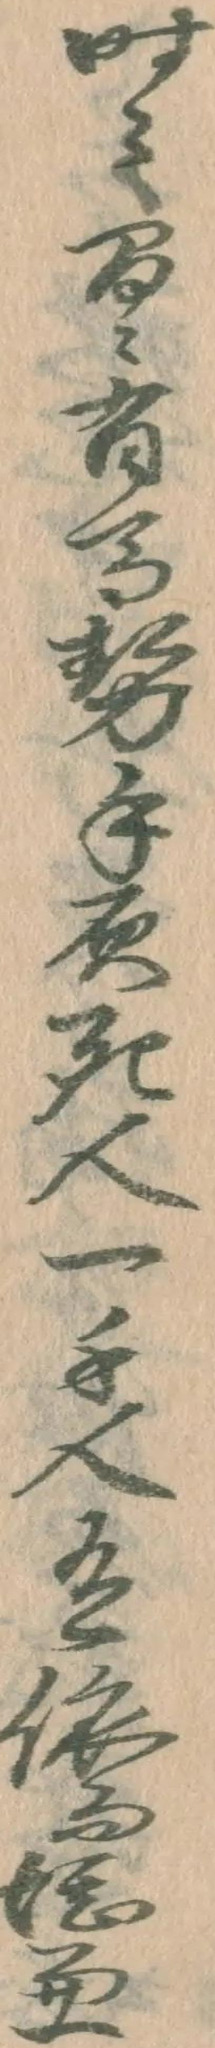時之間に有馬勢手負死人一千人有依而堀兼
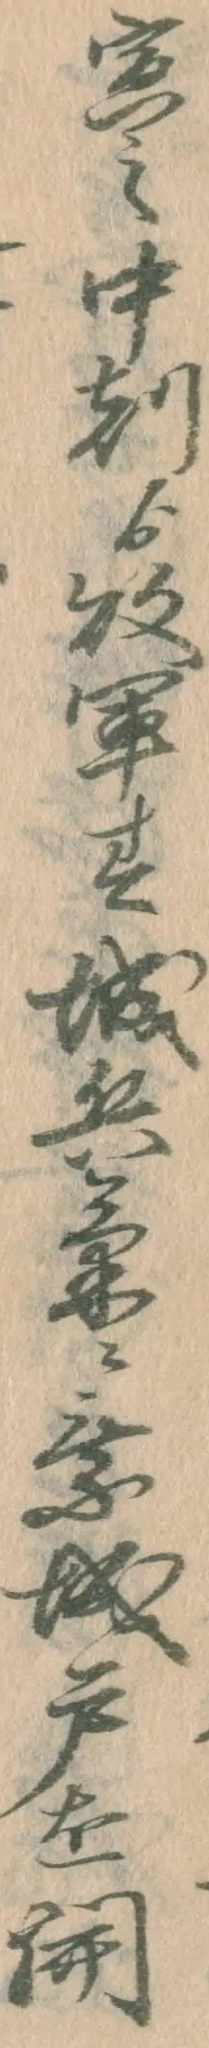寅之中刻ゟ敗軍春城兵気に乗城戸を開
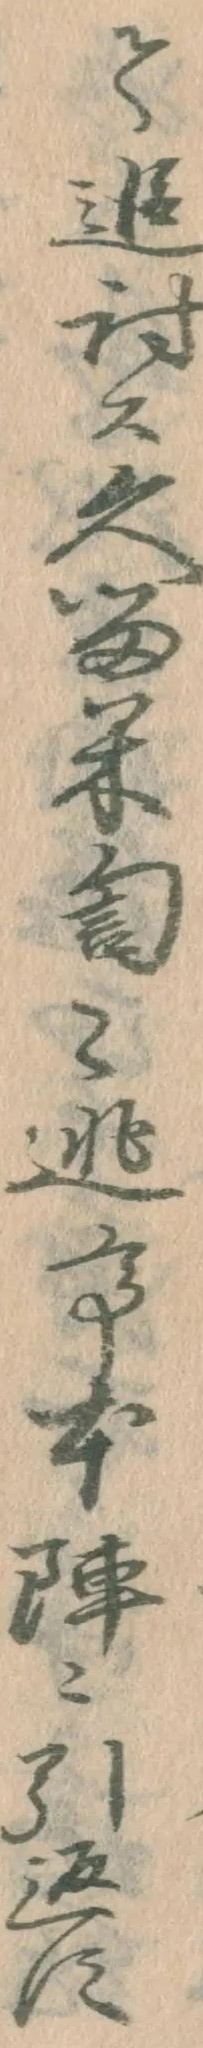て追討す久留米訇々逃亭本陣に引返須
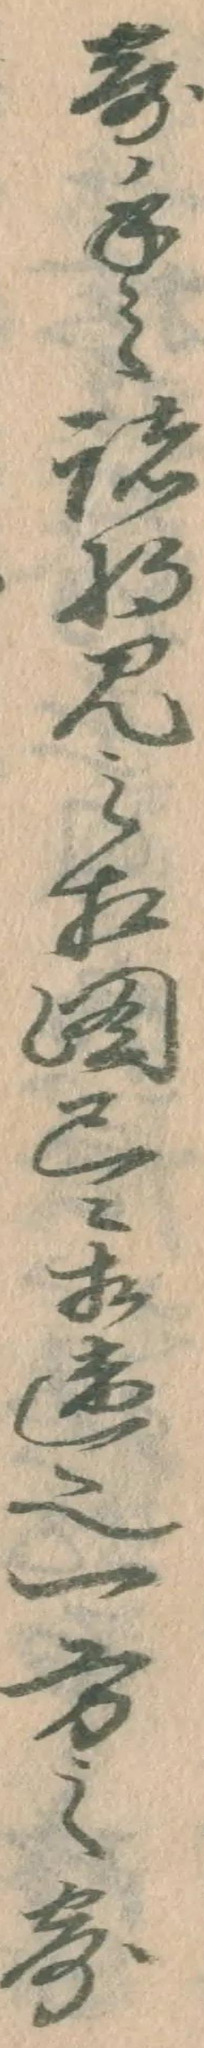寄手之諸将見之相図己に相迷也一方之寄
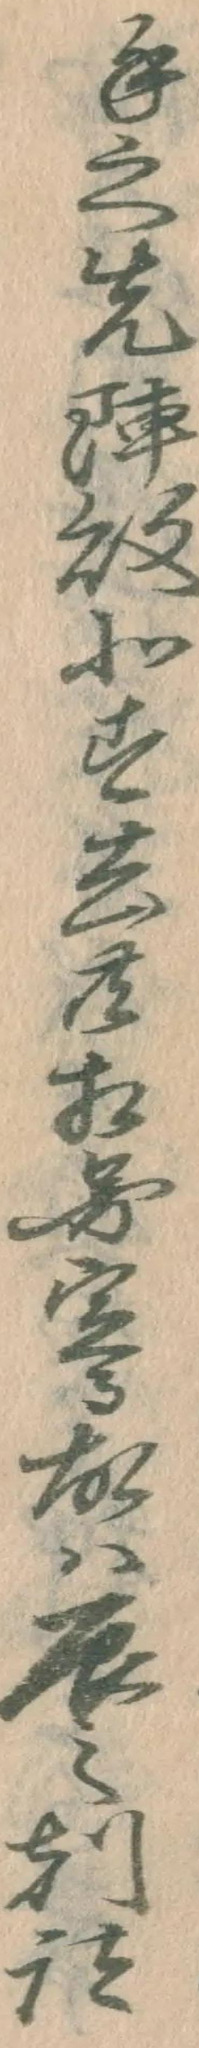手之先陣敗北春去共相図定る故は辰之刻諸
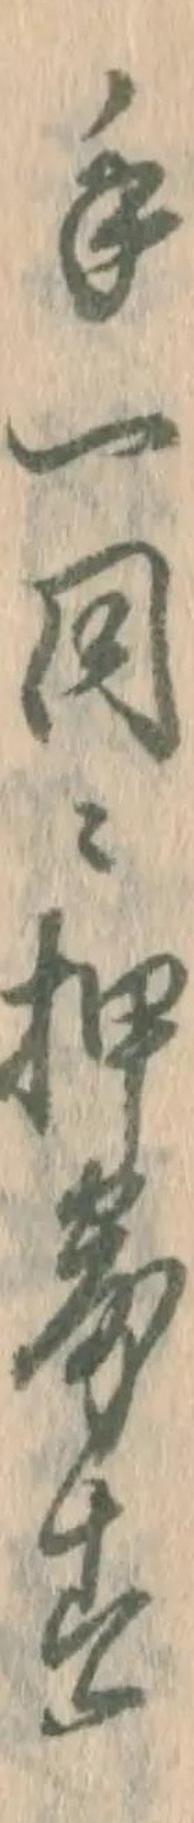手一同に押寄春
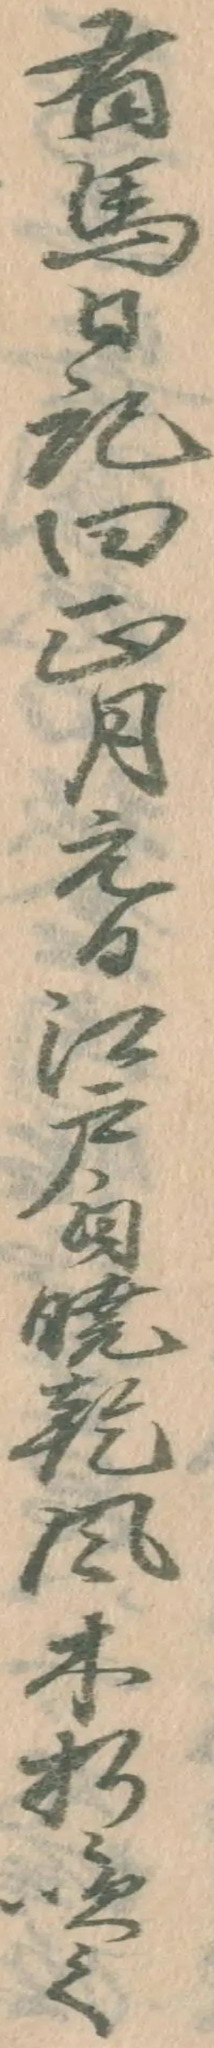有馬日記曰正月元日江戸自暁乾風木折に吹て
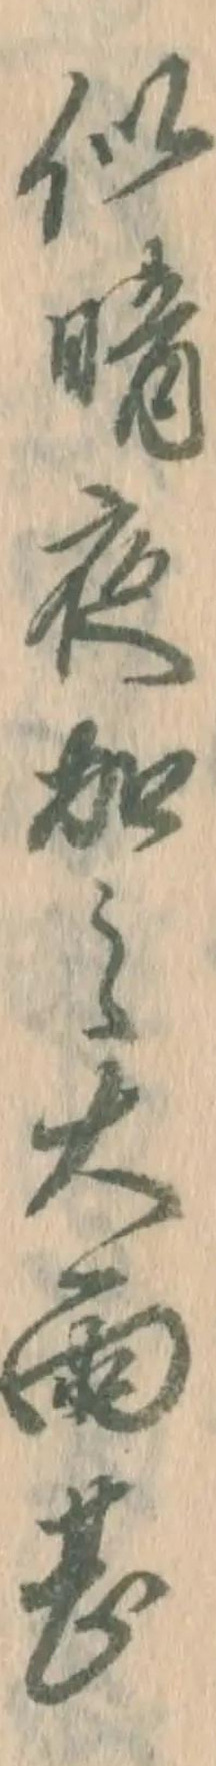似暗夜加之大雨甚

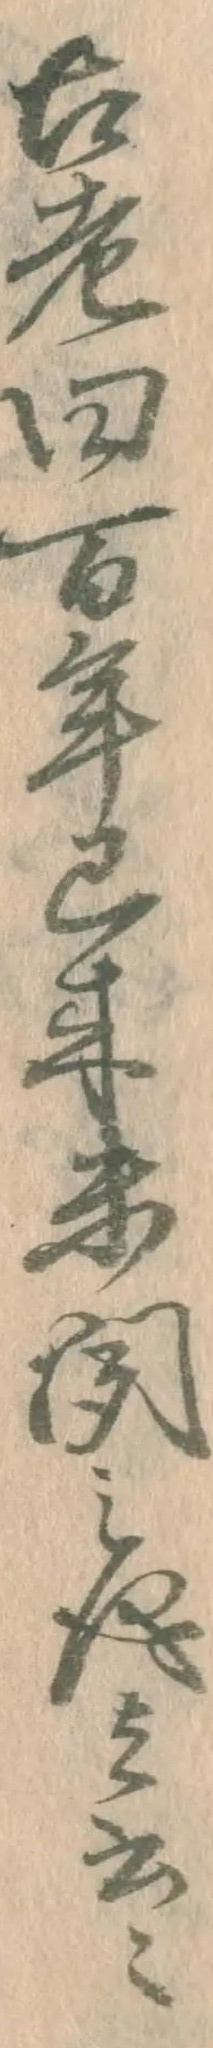古老曰百年已来未聞之儀与云々
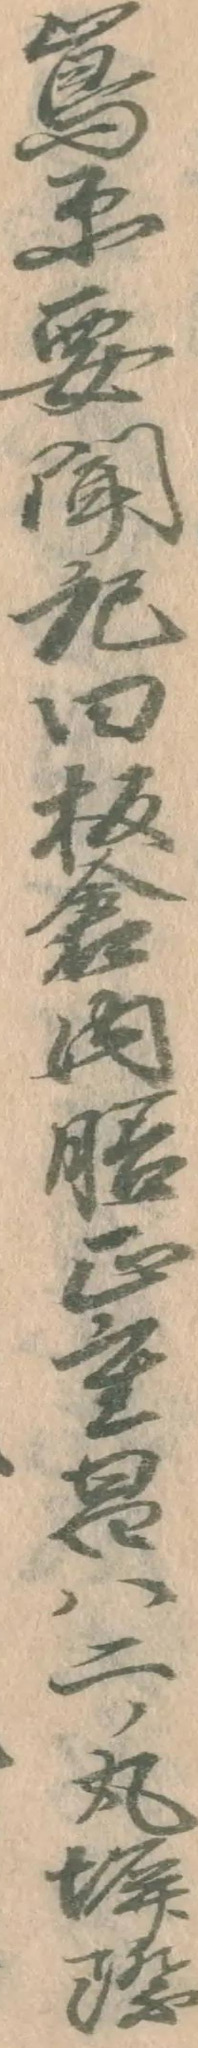島原要聞記曰板倉内膳正重昌は二之丸塀際
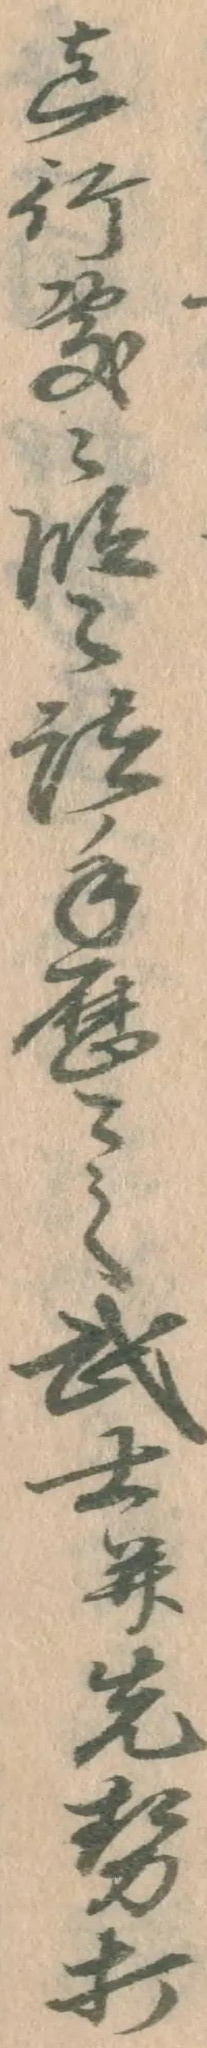迄行處に段々諸手歴々之武士幷先勢打
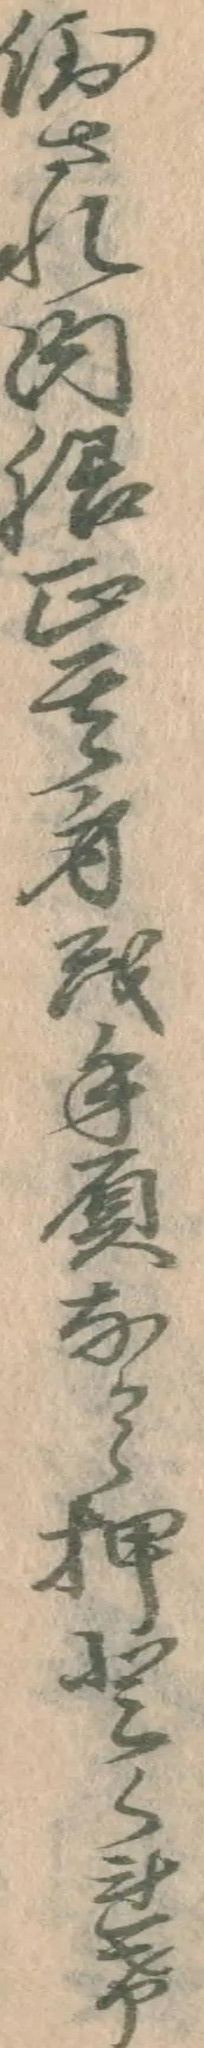倒され内膳正其身茂手負なから押登ら連希
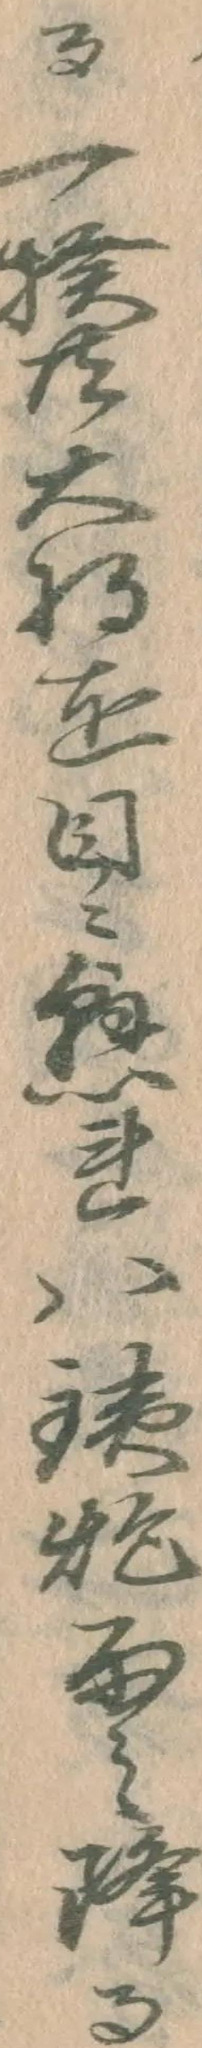る一揆共大将を目に懸連は鉄炮雨之降る
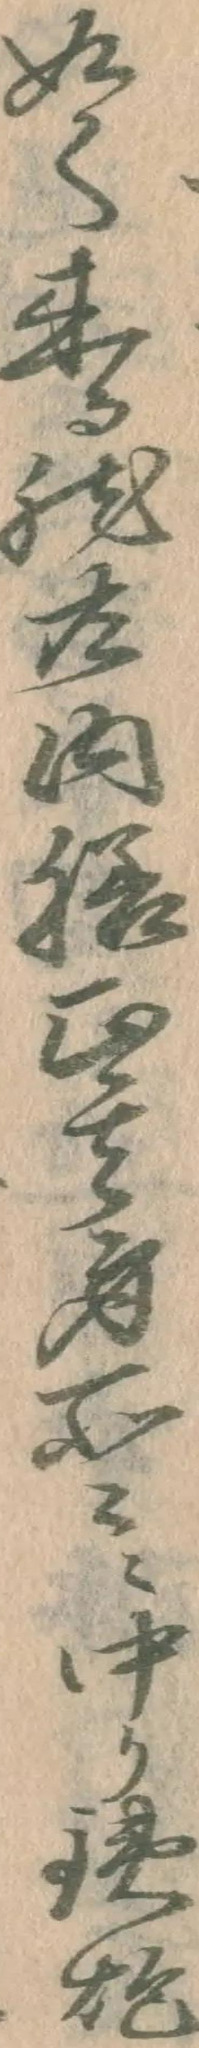如く来る然共内膳正其身所々に中り鉄炮
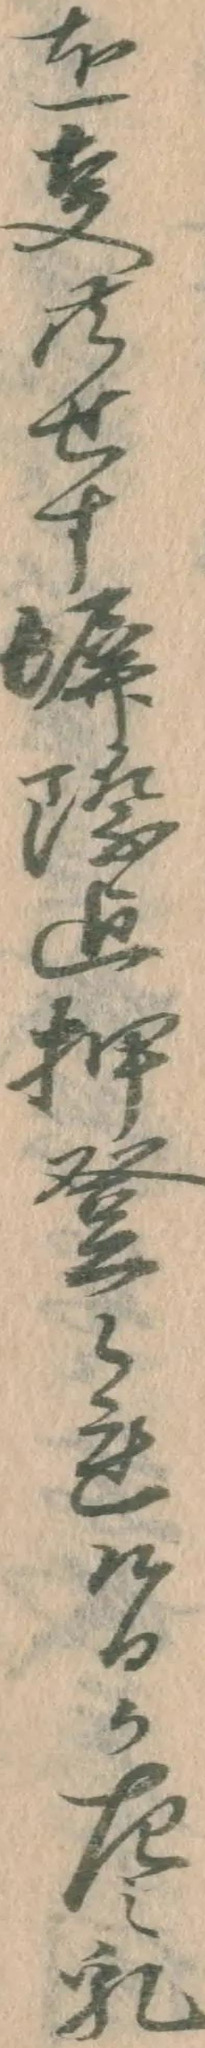を叓共せす塀際迄押登ら連けるか左之乳
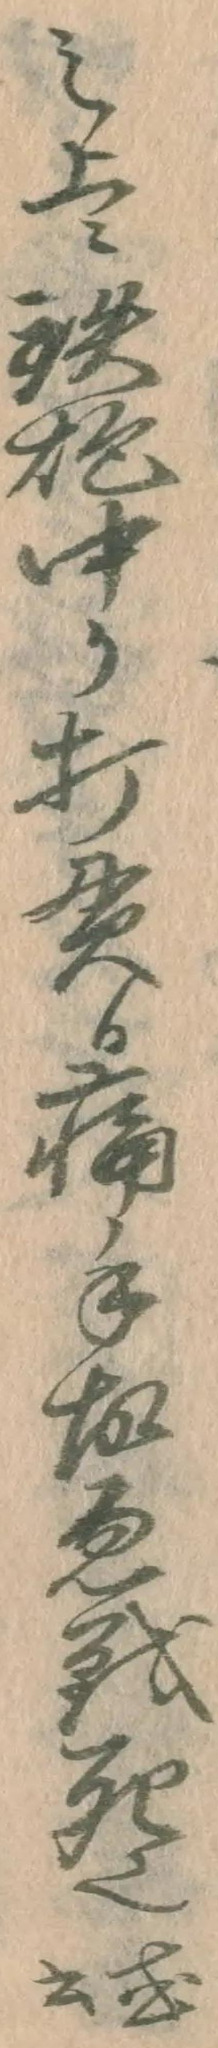之上に鉄炮中り打貫る痛手故忽戦死也或云
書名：切支丹御退治記 49巻. [5]
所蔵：国立国会図書館 National Diet Library, JAPAN
